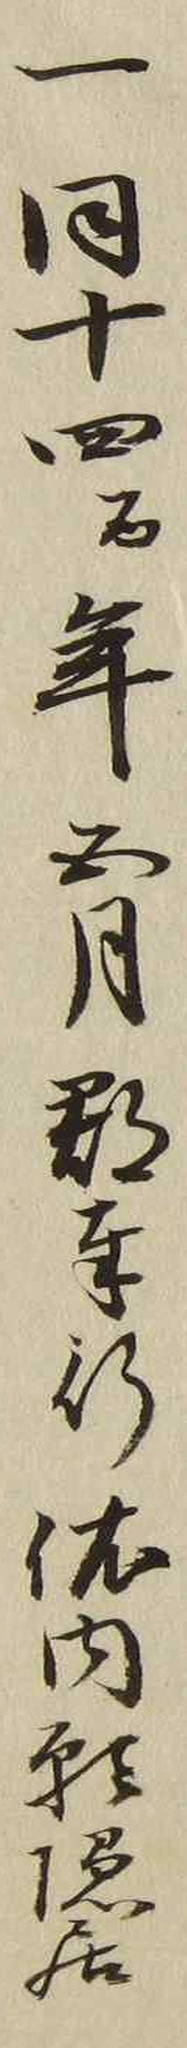一同十四酉年五月郡奉行依内願隠居

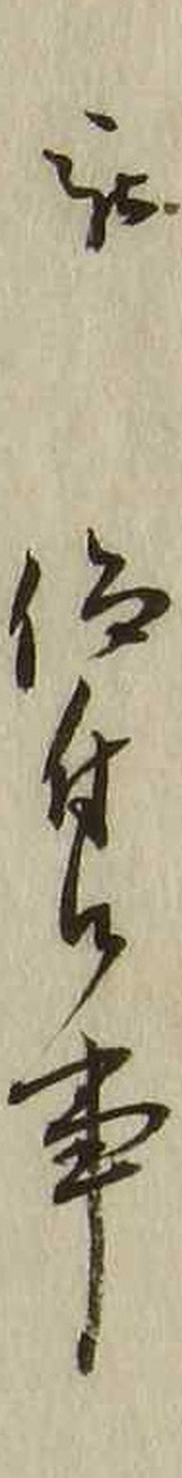被仰付候事
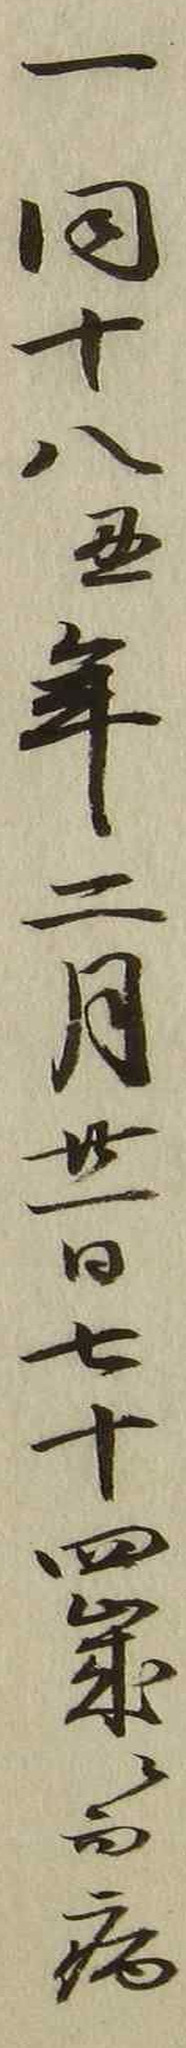一同十八丑年二月廿一日七十四歳ニ而病
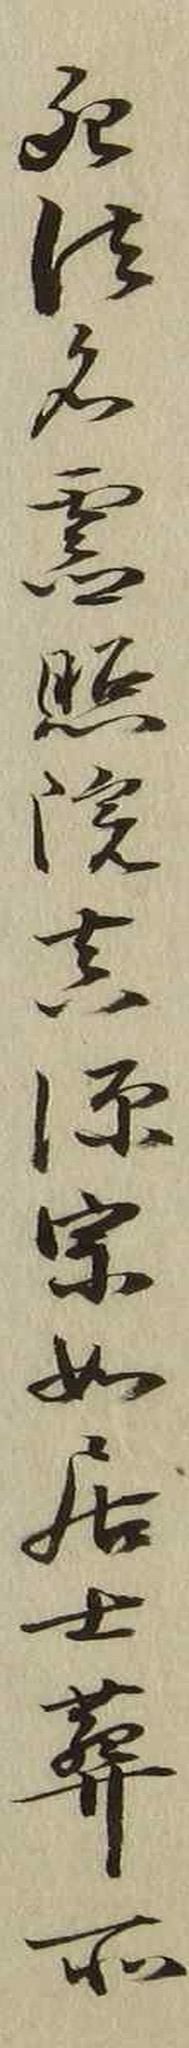死法名雲照院真源宗如居士葬所
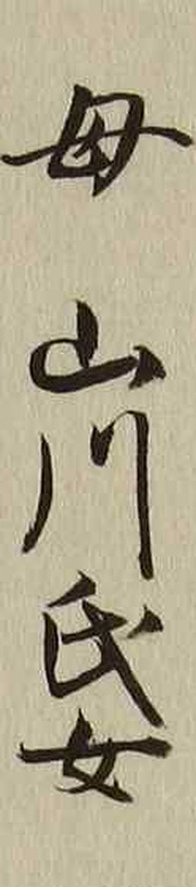母山川氏女
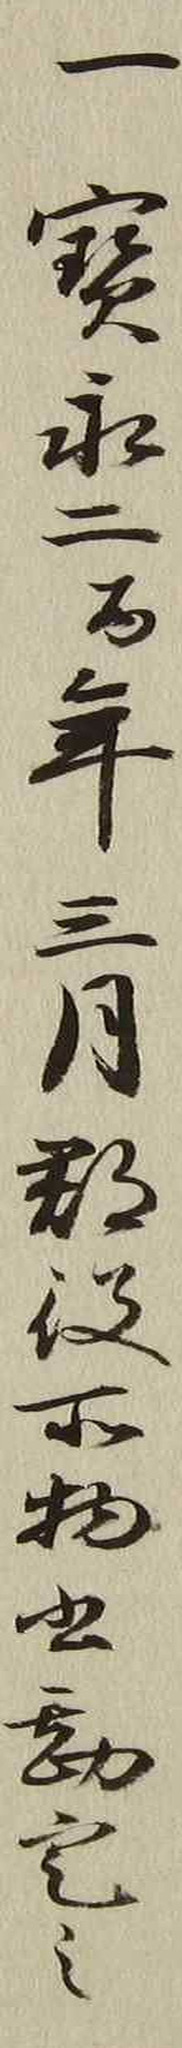一寛永二酉年三月郡役所物書勘定之
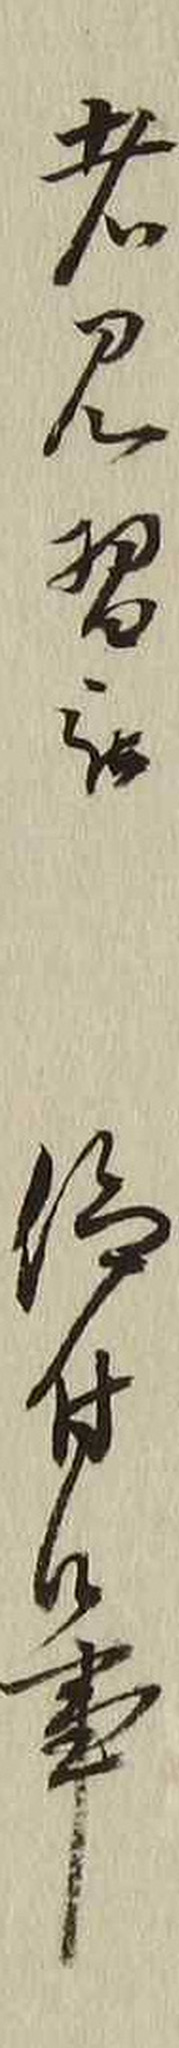者見習被仰付候事
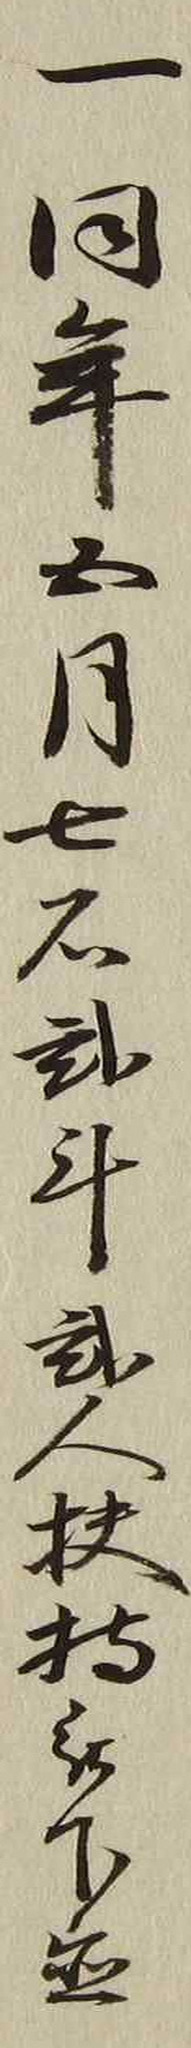一同年五月七石弐斗弐人扶持被下置
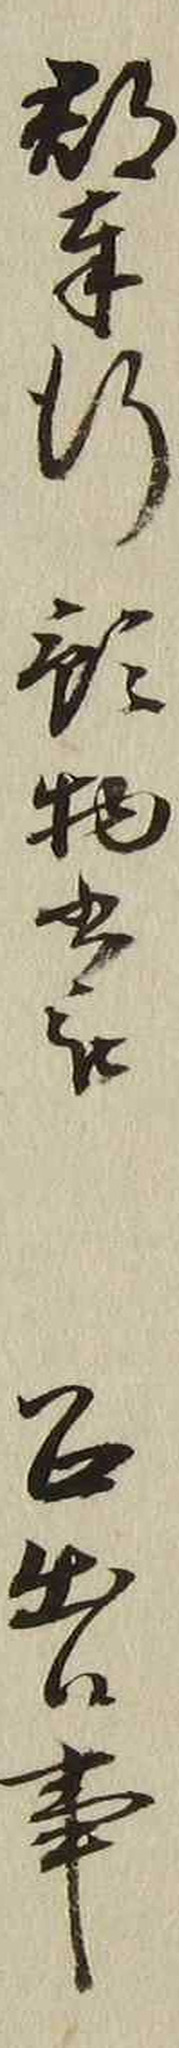郡奉行預物書被召出候事
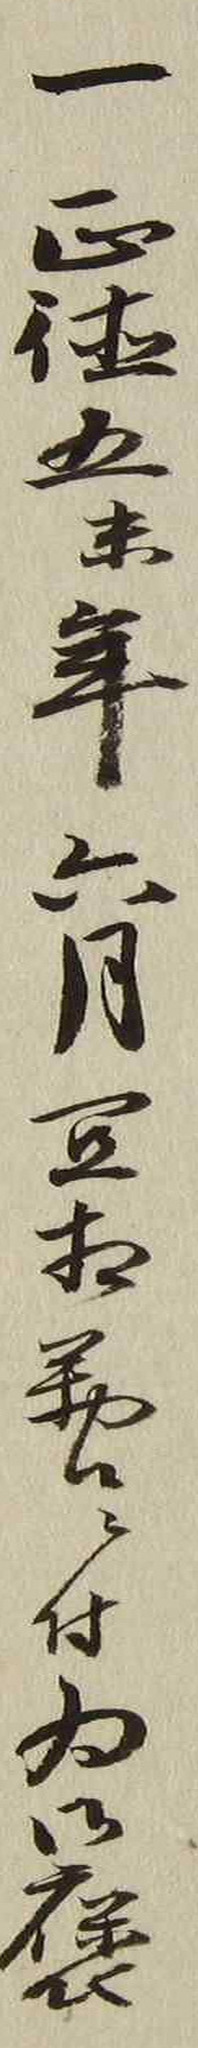一正徳五未年六月宜相勤候ニ付為御褒
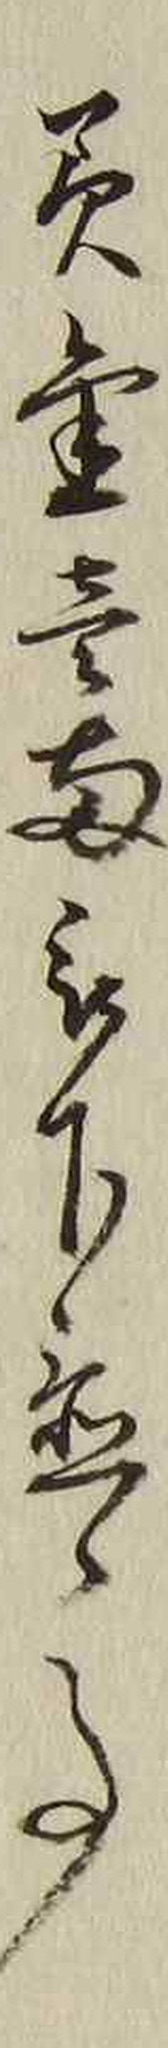美金壱両被下置候事
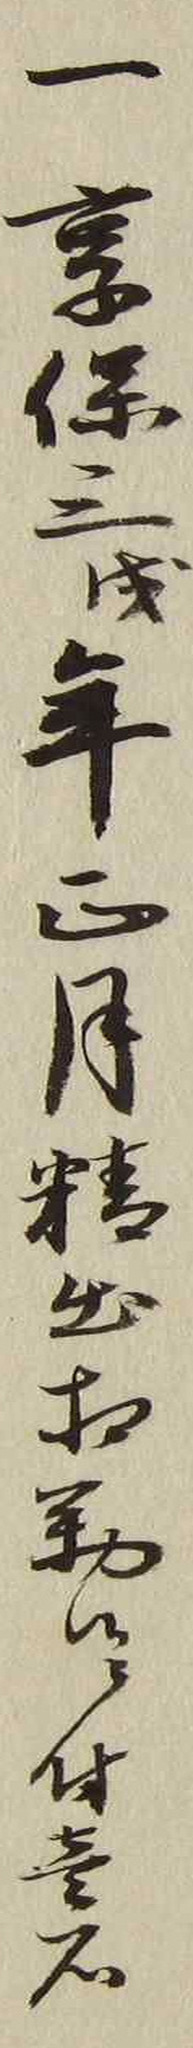一享保三戌年正月精出相勤候ニ付壱石
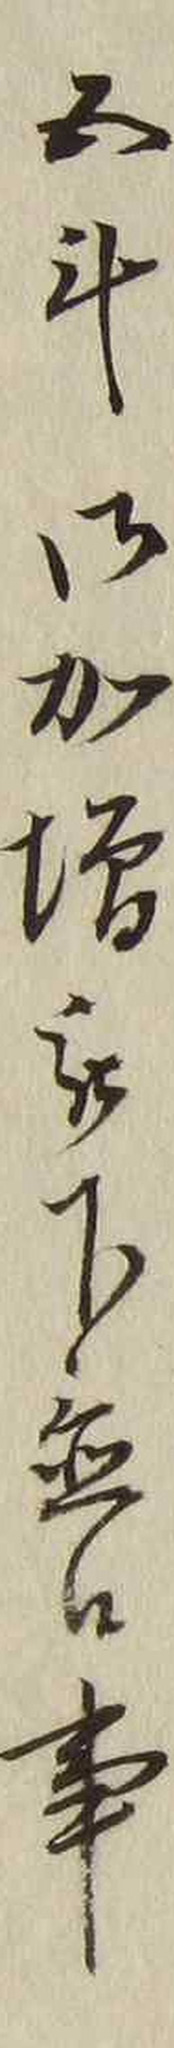五斗御加増被下置候事

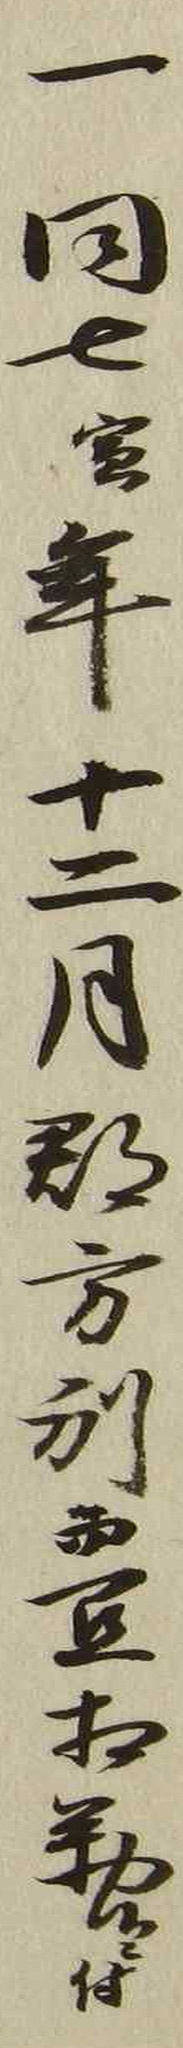一同七寅年十二月郡方別而宜相勤候ニ付
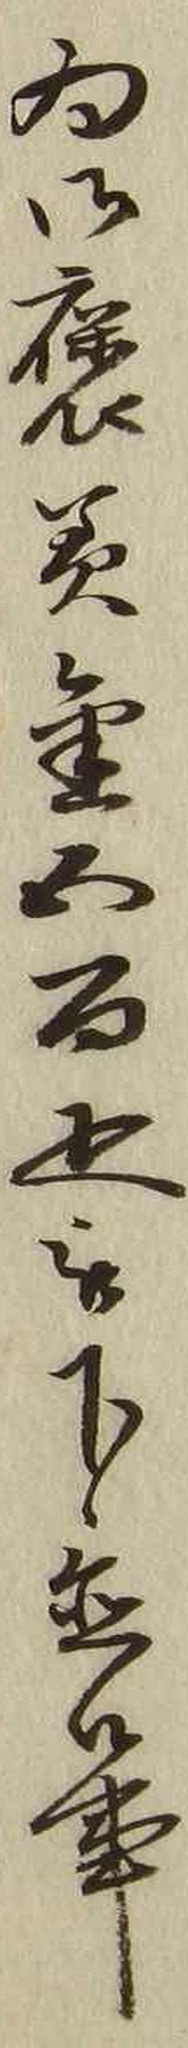為御褒美金五百疋被下置候事
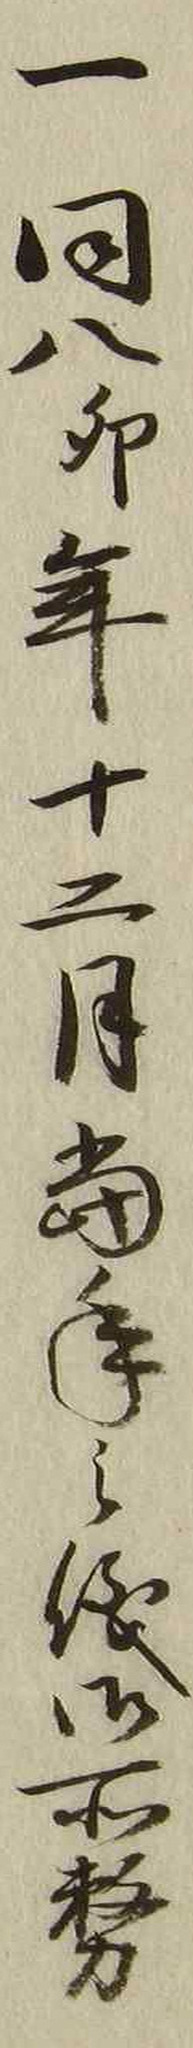一同八卯年十二月当年之儀御所務
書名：諸士系譜　巻之61　と之部4
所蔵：会津若松市立会津図書館
